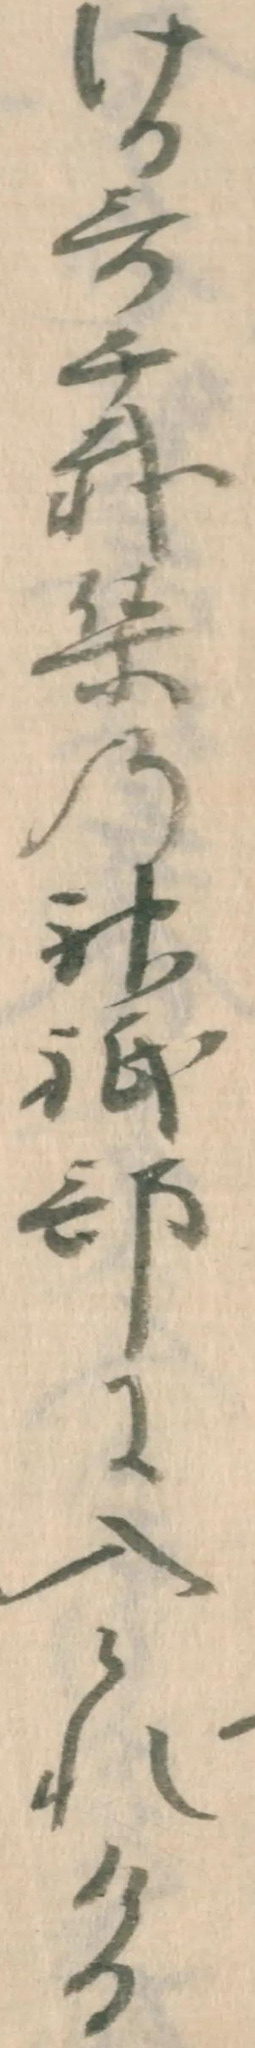ける哥千載集の神祇部に入られける
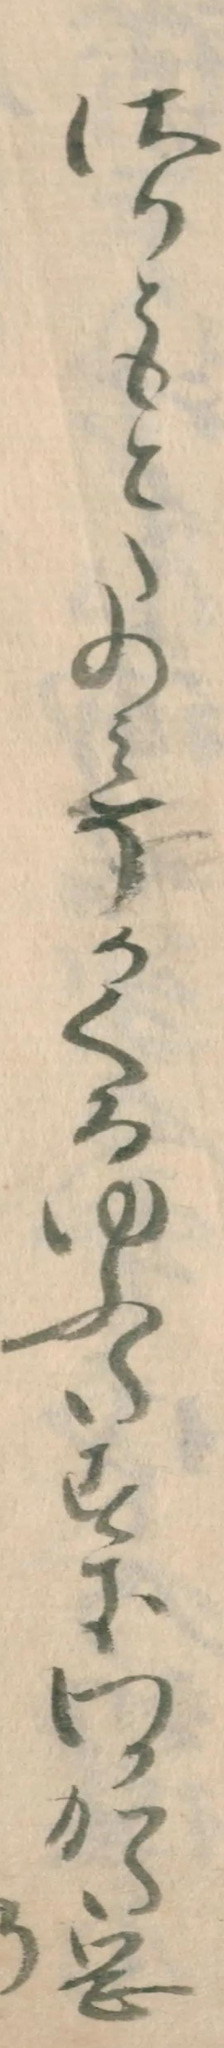さりともとたのみそかくるゆふたすきわかかた岡の
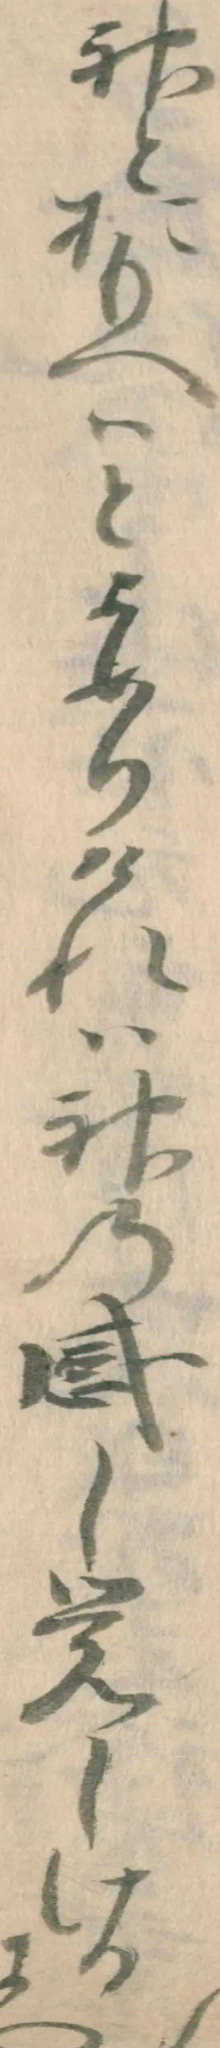神とおもへはとよめりけれは神の感し覚しけるにや
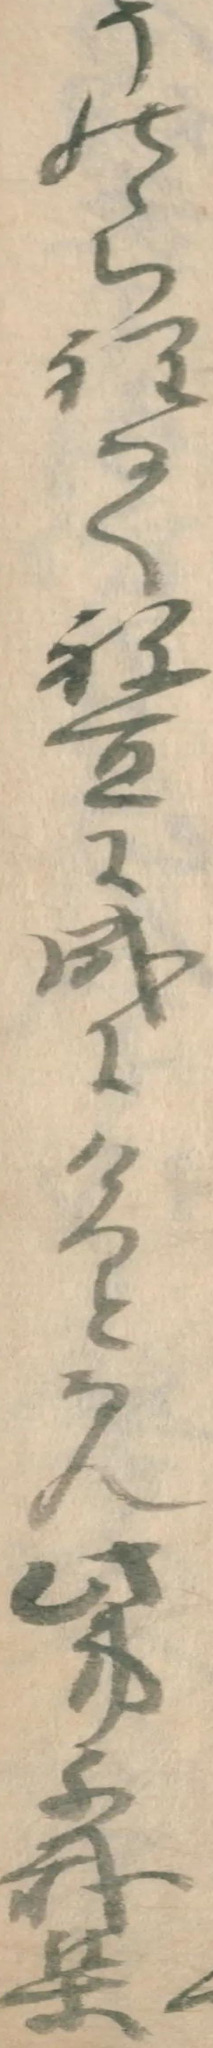そのゝち程なく祢宜に成にけるとなん此事千載集

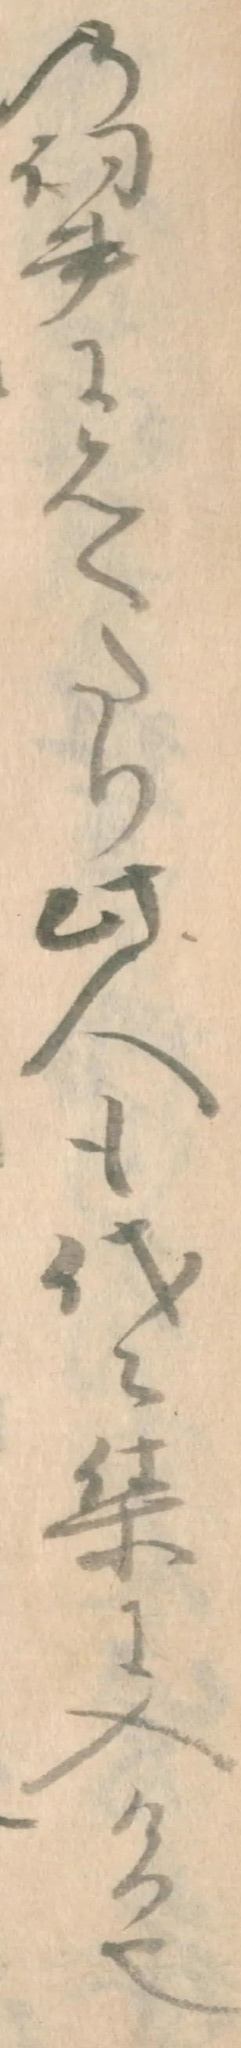の詞書に見えたり此人も代々集に入ける也
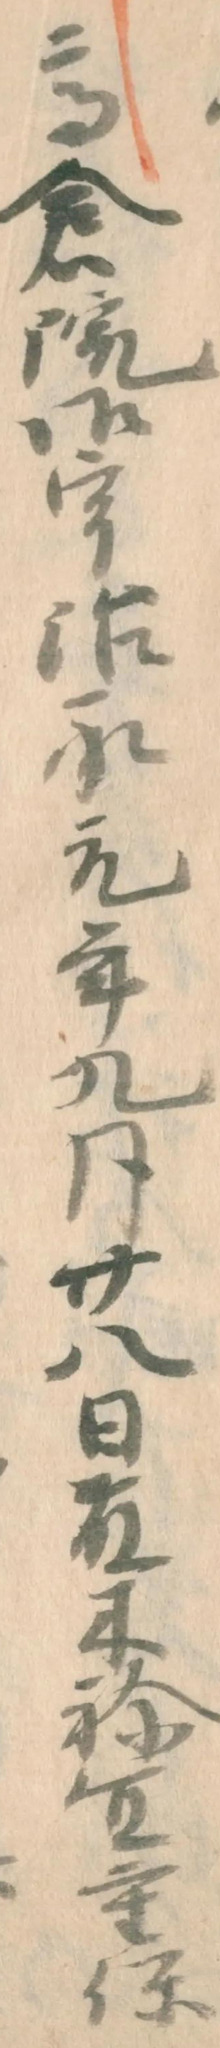高倉院御宇治承元年九月廿八日藤木祢宜重保
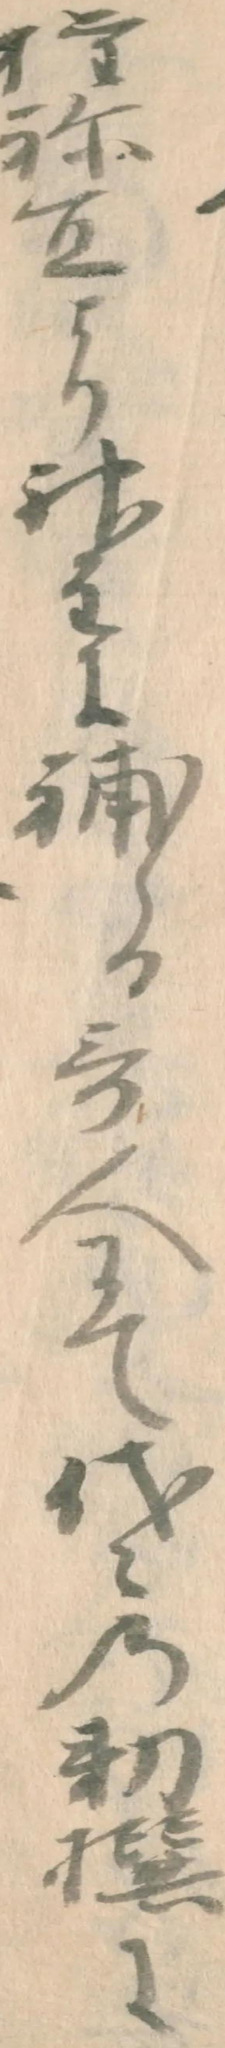権祢宜より神主に補らる哥人にて代々の勅撰に
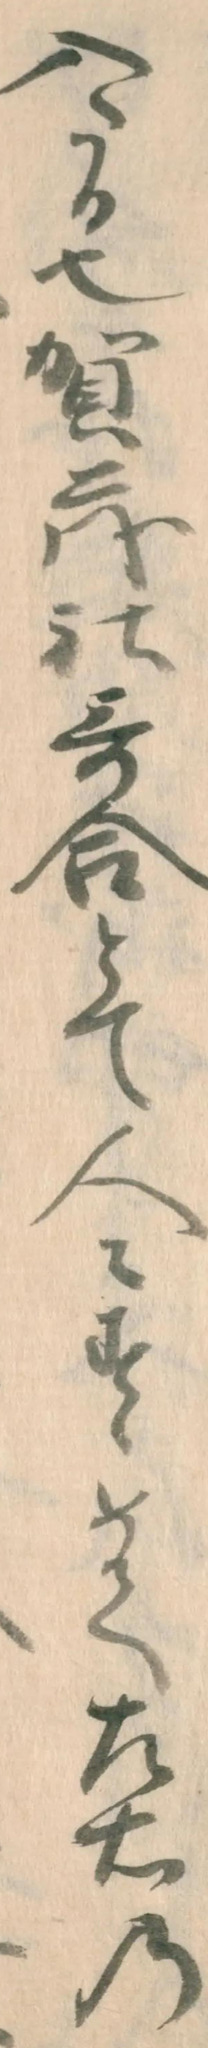入たる也賀茂社哥合とて人々すゝめて左右の
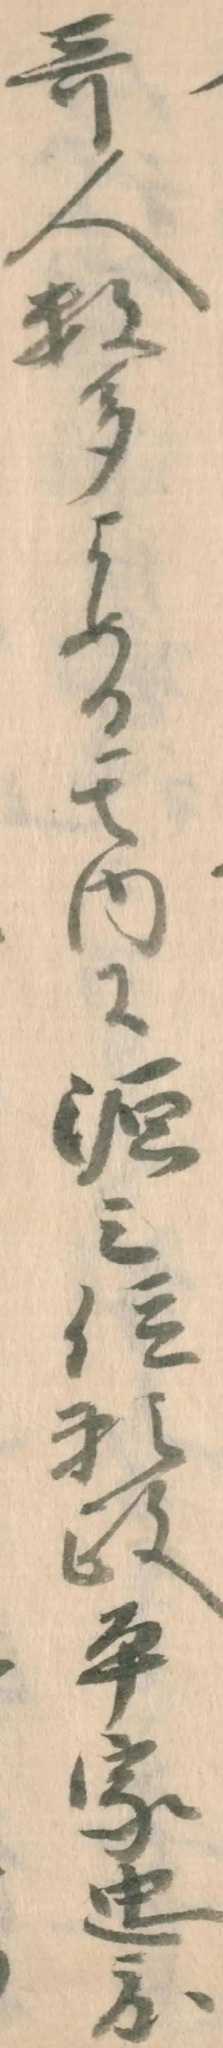哥人数多よめる其内に源三位頼政平家忠度
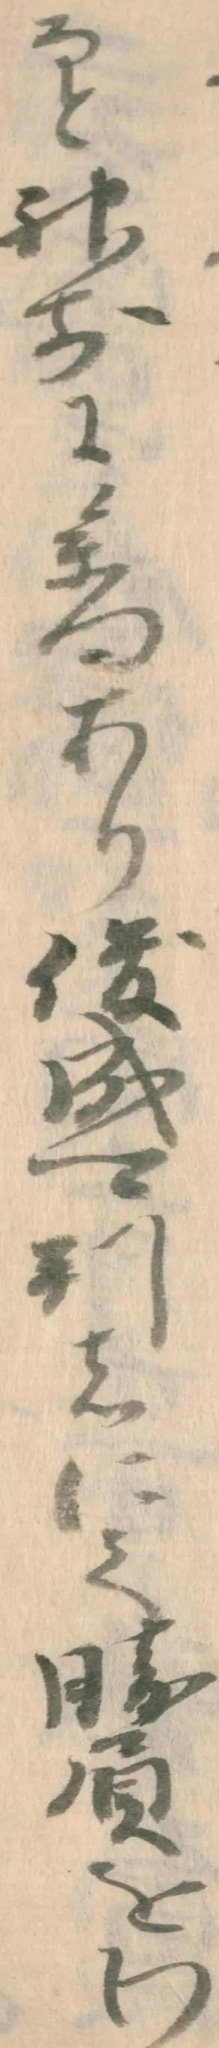なと神前に参向あり俊成卿判者にて勝負をわ
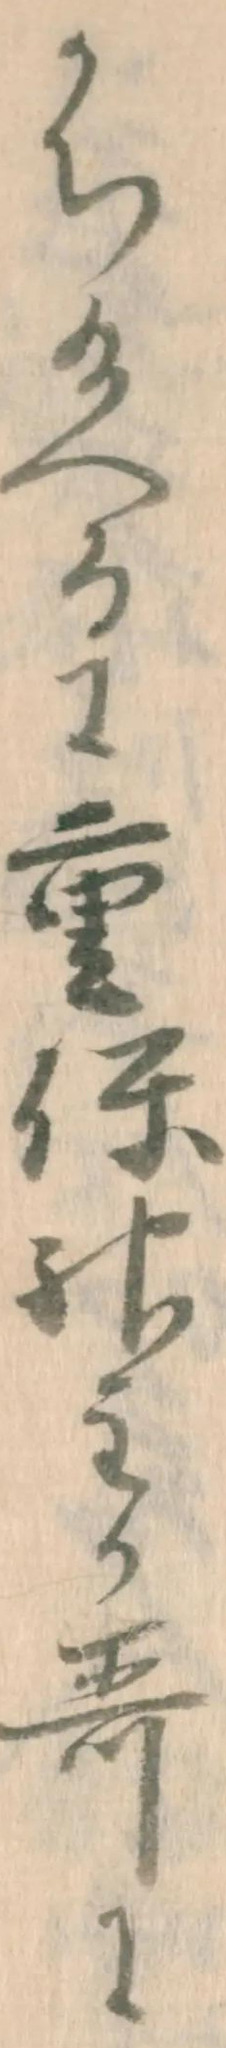かち給へるに重保神主か哥に
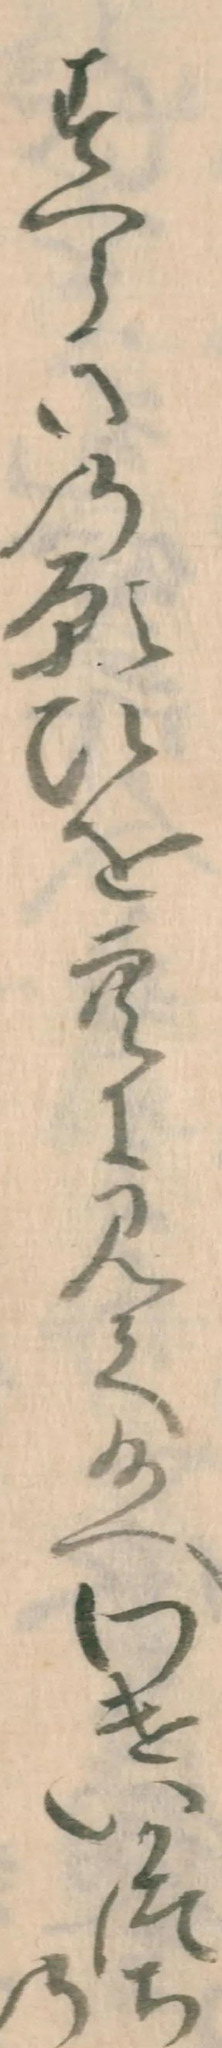すへらきの願ひを空に見て給へわけいかつちの
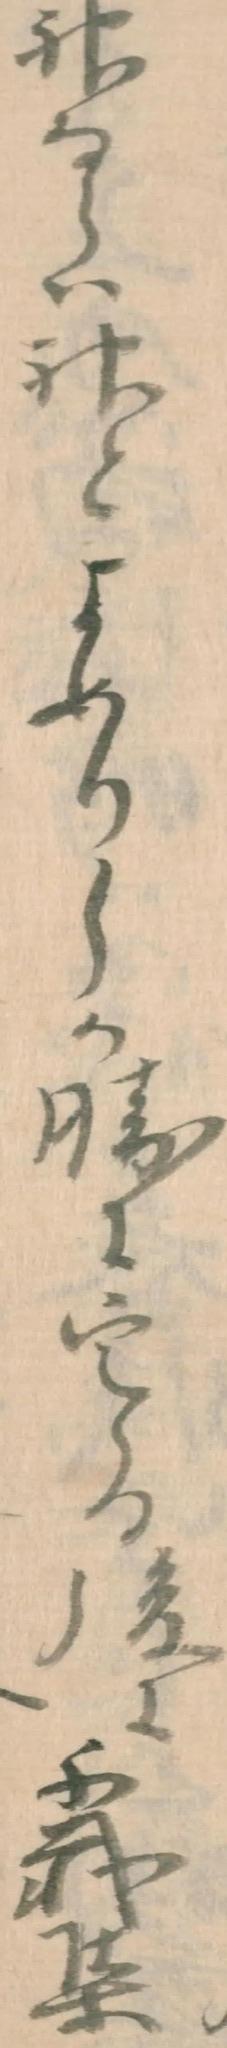神ならは神とよめりしか勝に定る後に千載集
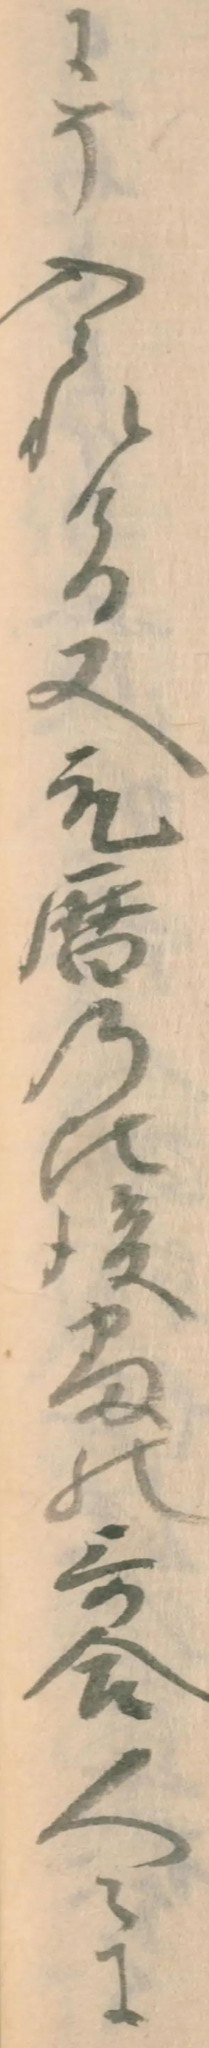にそ入られける又元暦の比後番の哥合人々に
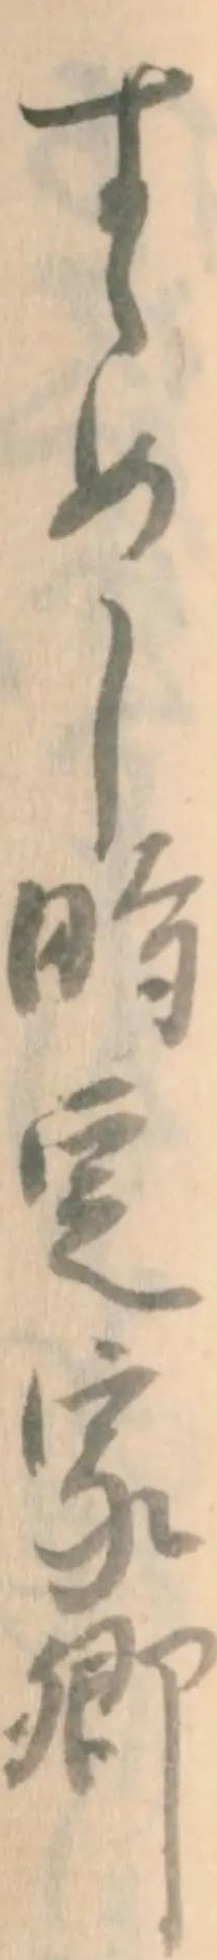すゝめし時定家卿
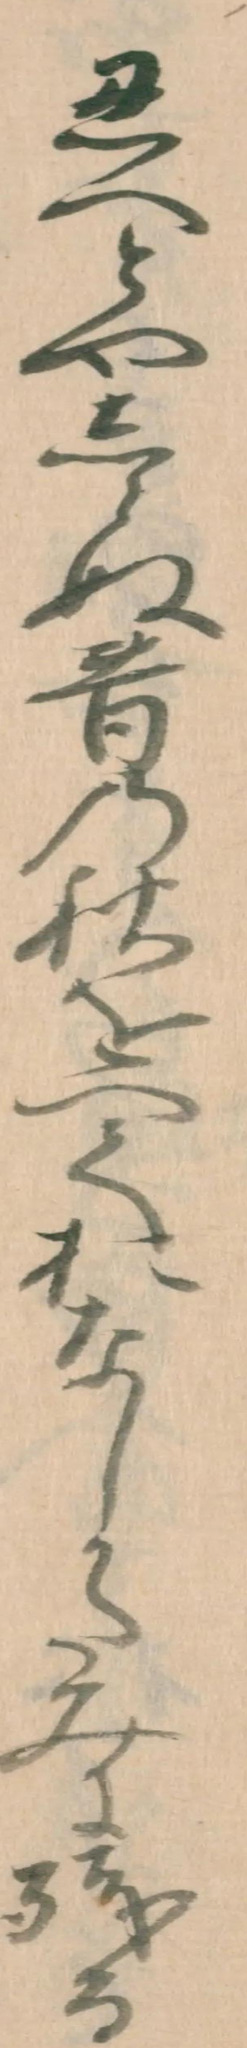忍へとやしらぬ昔の秋をへておなしかたみに残る
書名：賀茂社記録. 第1冊
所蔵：国立国会図書館 National Diet Library, JAPAN
